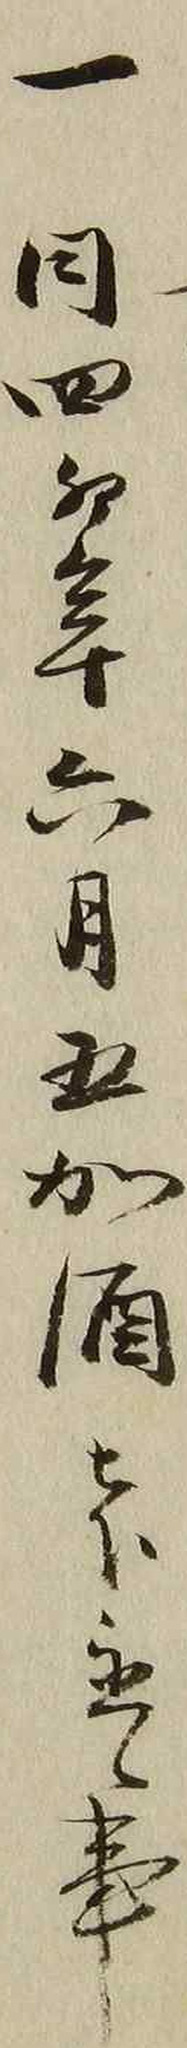一同四卯年六月五加酒被下置候事
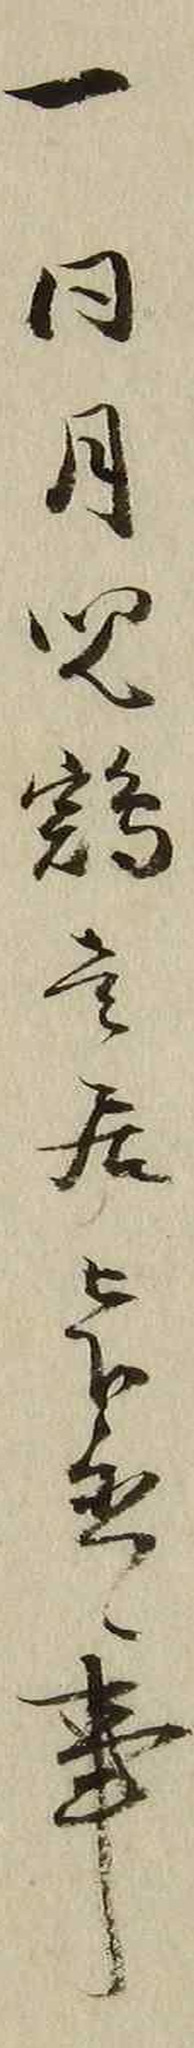一同月児鶴壱居被下置候事
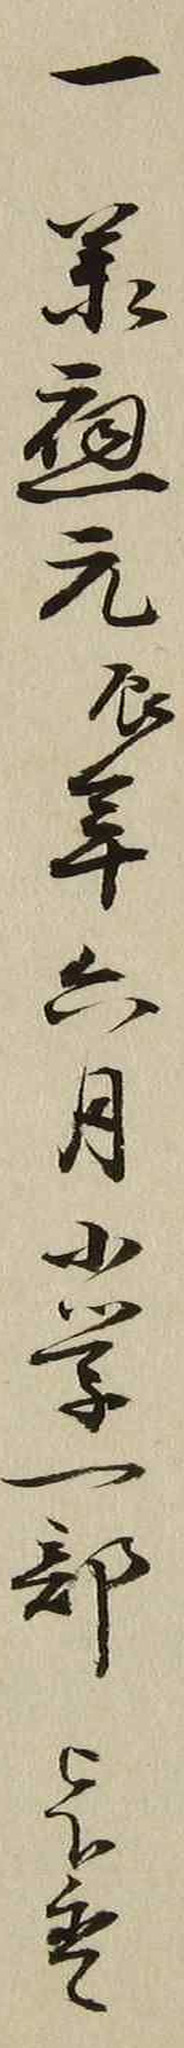一承応元辰年六月小学一部被下置候事
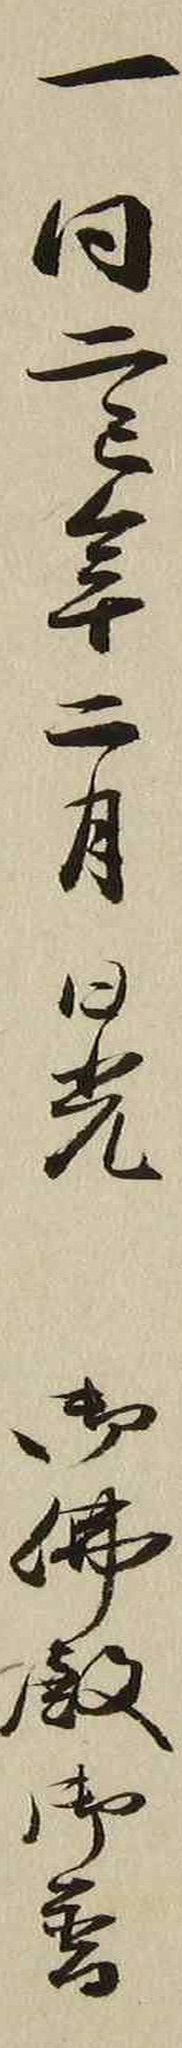一同二巳年正月日光御仏殿御普
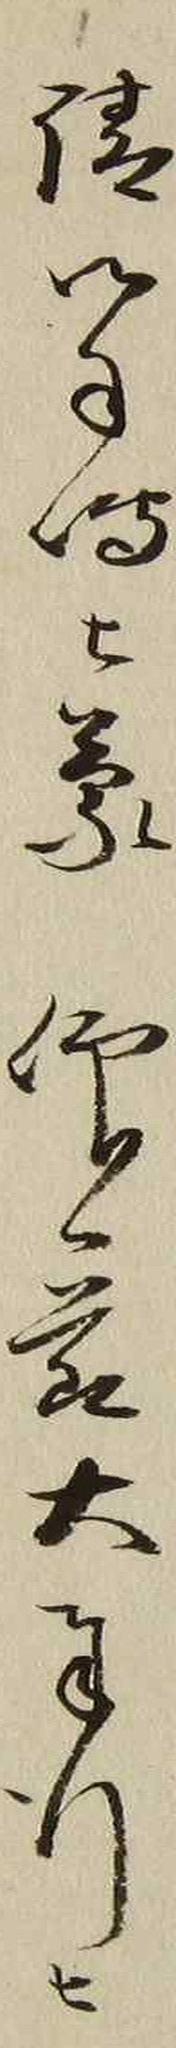請御手伝被被仰候節大奉行被
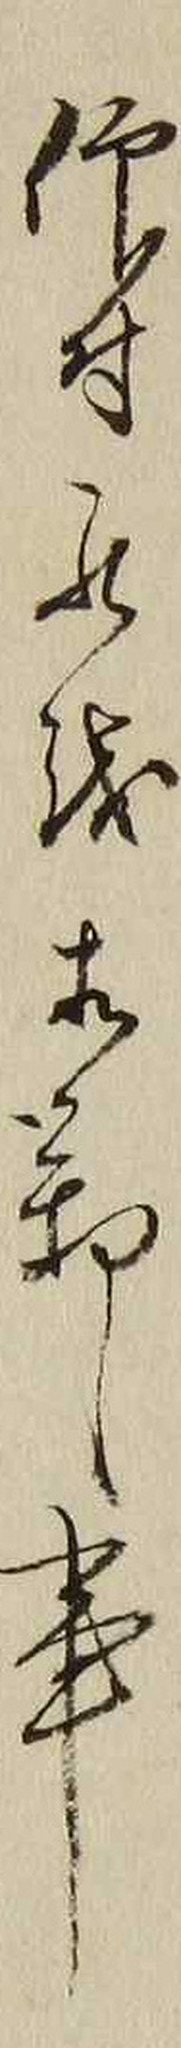仰付罷越相勤候事
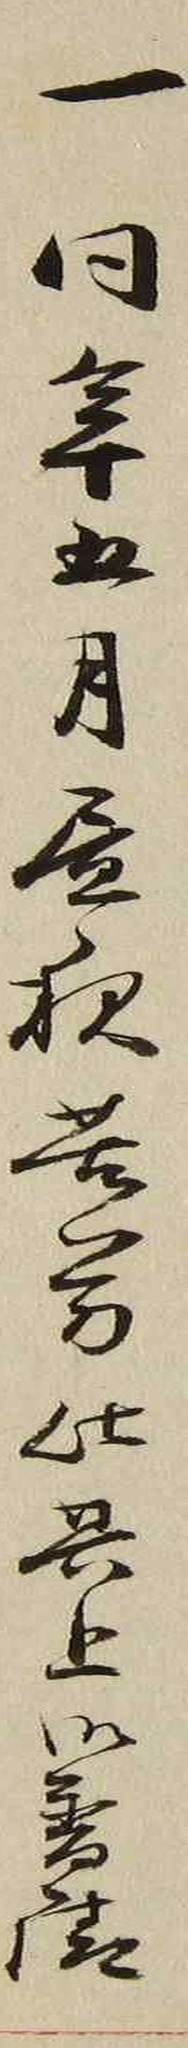一同年五月昼夜苦労仕其上御普請
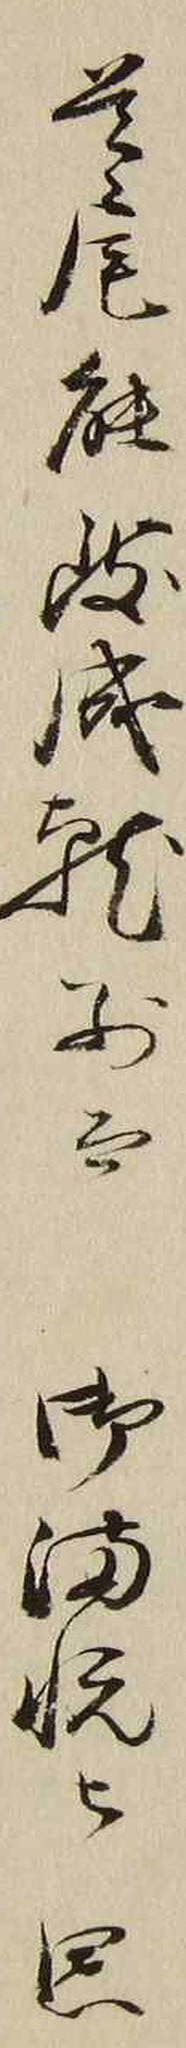首尾能致成就別而御満悦被思
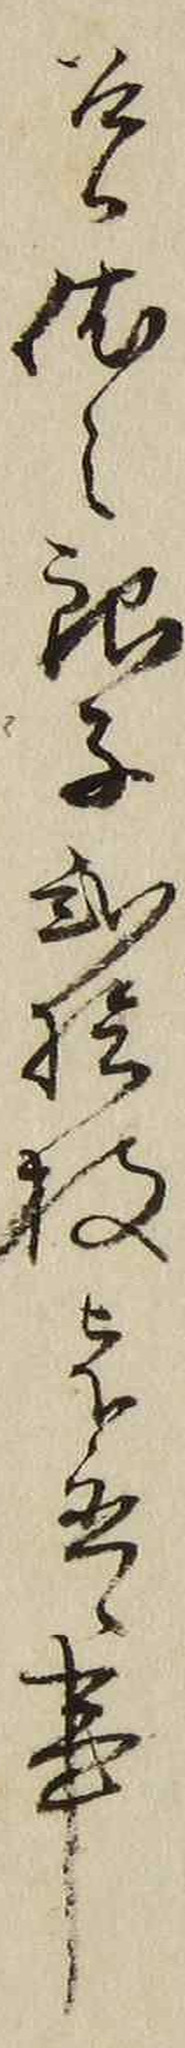召候依之銀子弐拾枚被下置候事
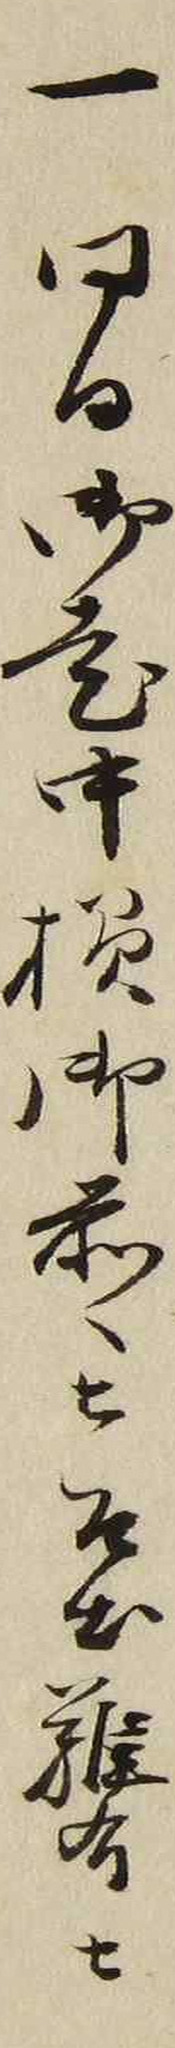一同日御老中様御前へ被罷出難有被
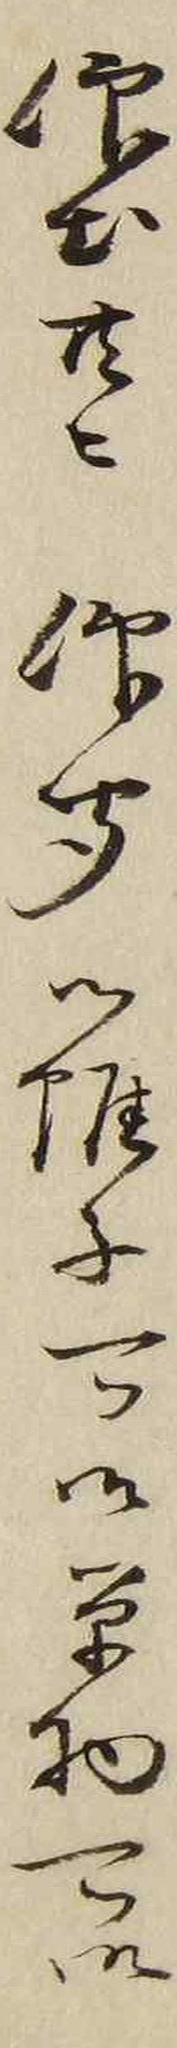仰出共被仰聞御帷子一つ単物一つ御

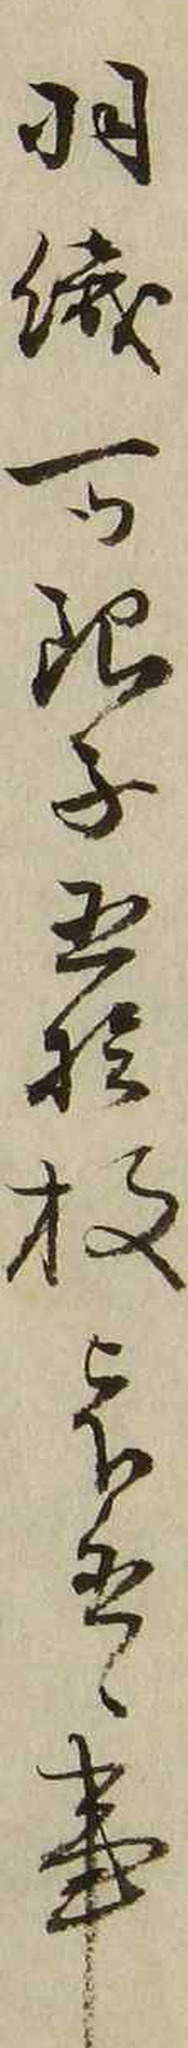羽織一つ銀子五拾枚被下置候事
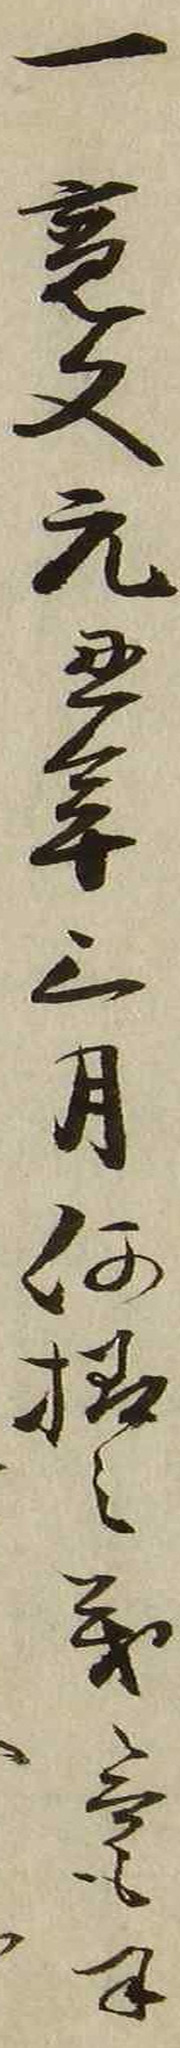一寛文元丑年三月何様之義に而も奉
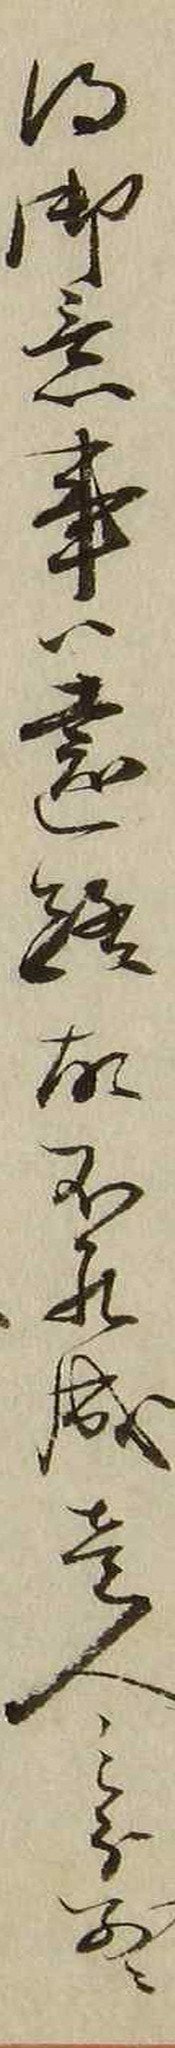得御意事は遠路故不相成壱人之分別に
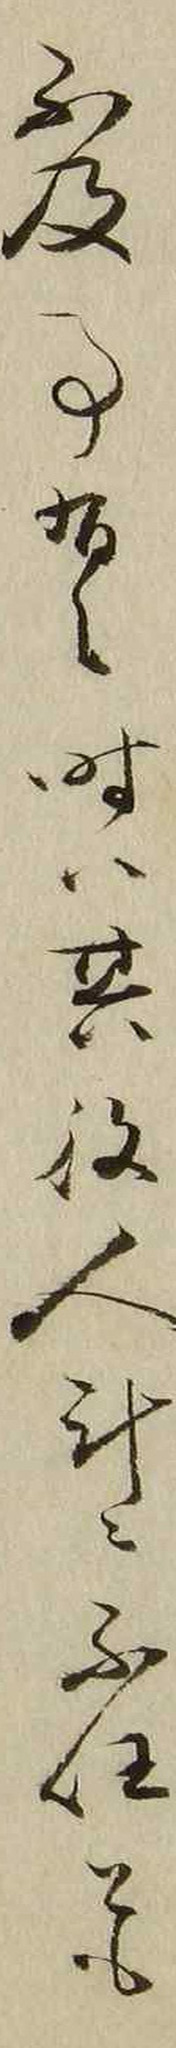不及事有之時は其役人計に不任とも
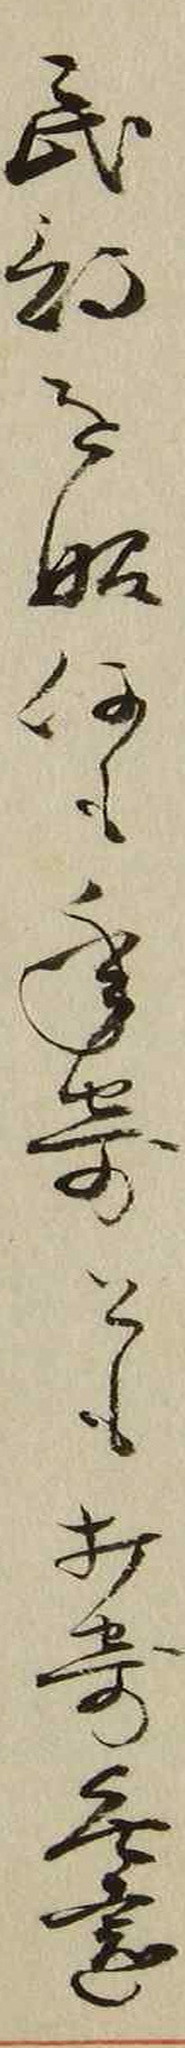民部を始何も年寄とも打寄無遠
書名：諸士系譜　巻之292　き之部1
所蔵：会津若松市立会津図書館
